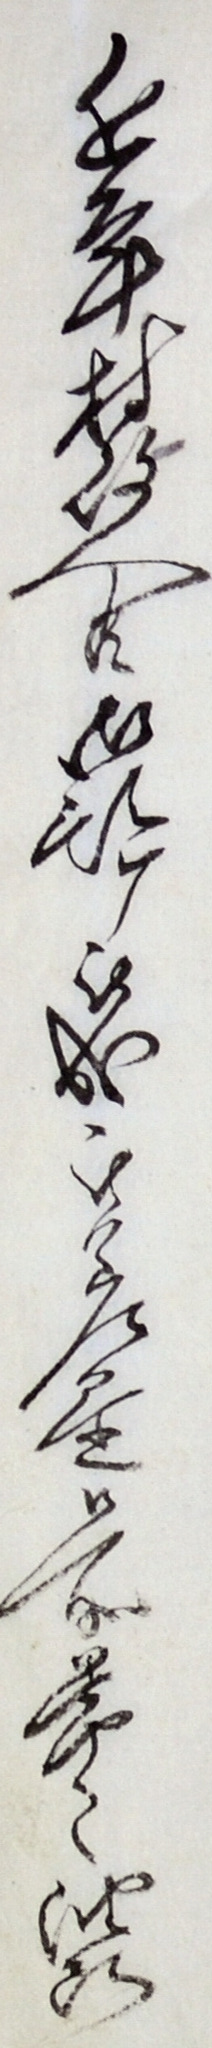近年村役人共御預ヶ被成被差置候所常々油断

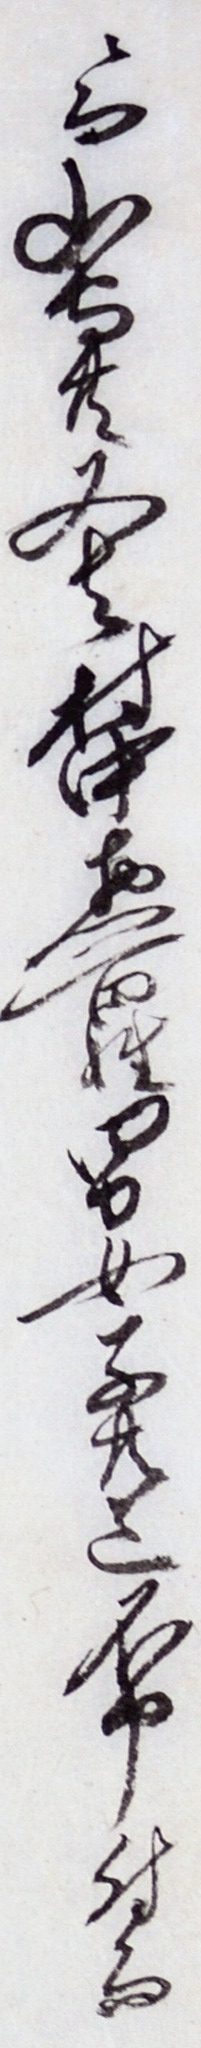ニ而山守共又者村中惣百姓男女子共迄不申付而
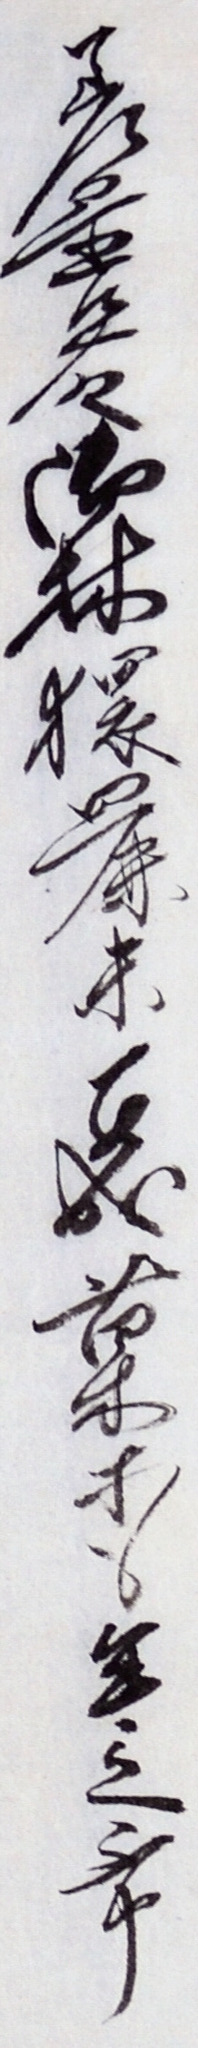差置候故御林猥粗麁末罷成苗木等も生立不申
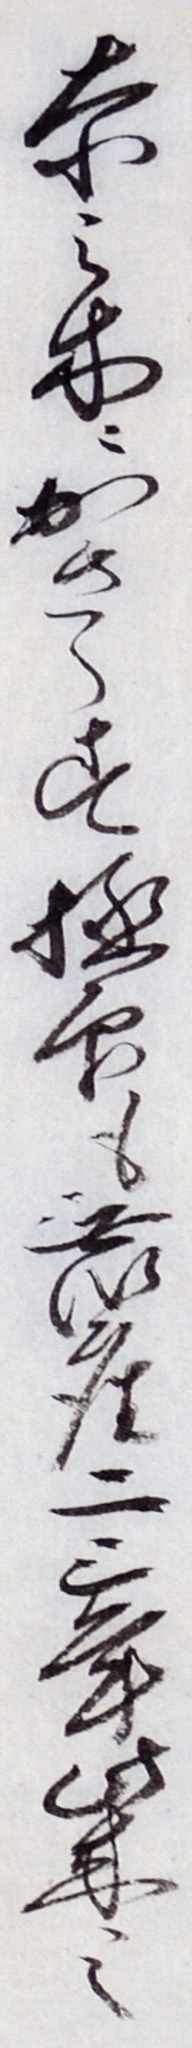大小之木ニかきらす極印も無御座二三年柴之
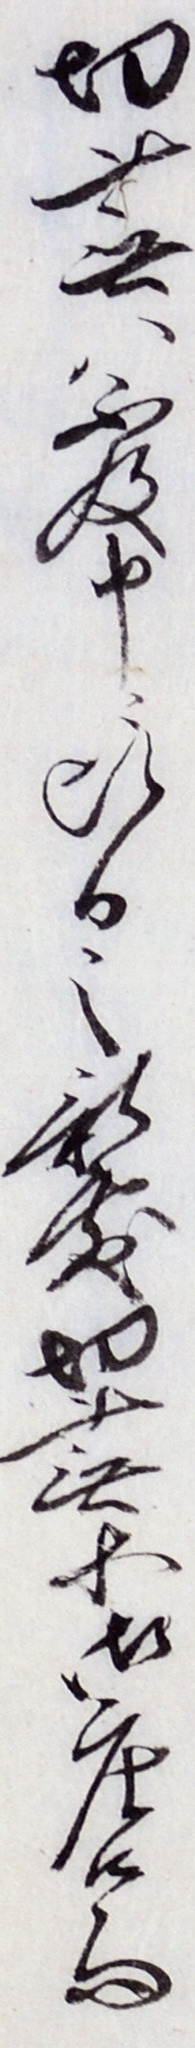切蕪ハ不及申ニ頃日之新敷切蕪等御座候而
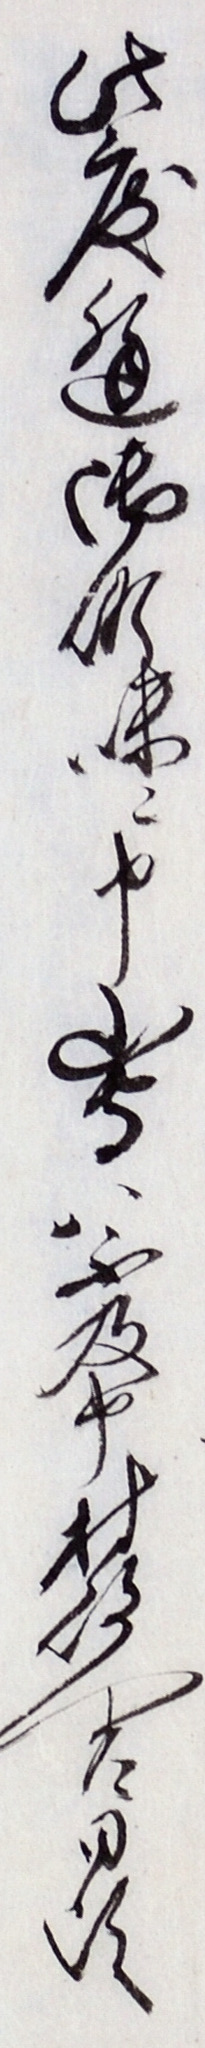此度逢御吟味ニ申山守ハ不及申村役人者日頃
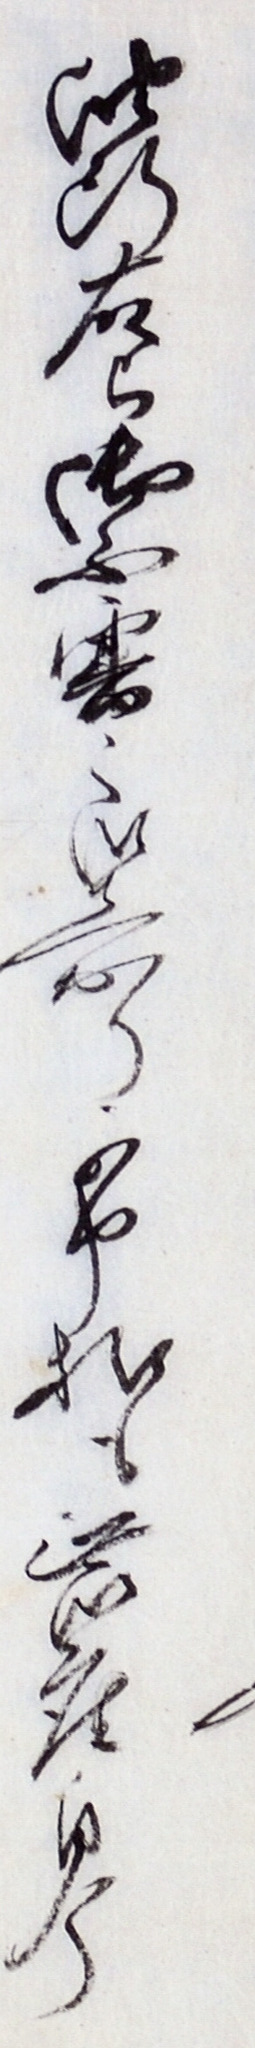油断故御不審之御しかり可申様も無御座自今
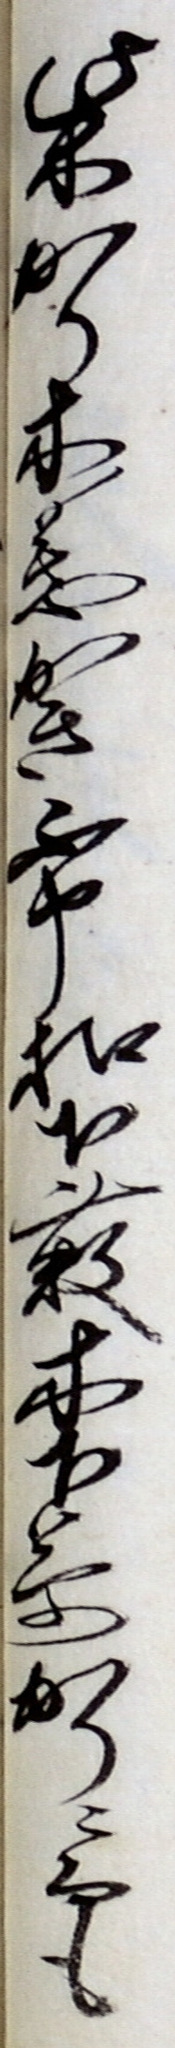柴かり木葉かき不申様下薮木下草かりニ而も
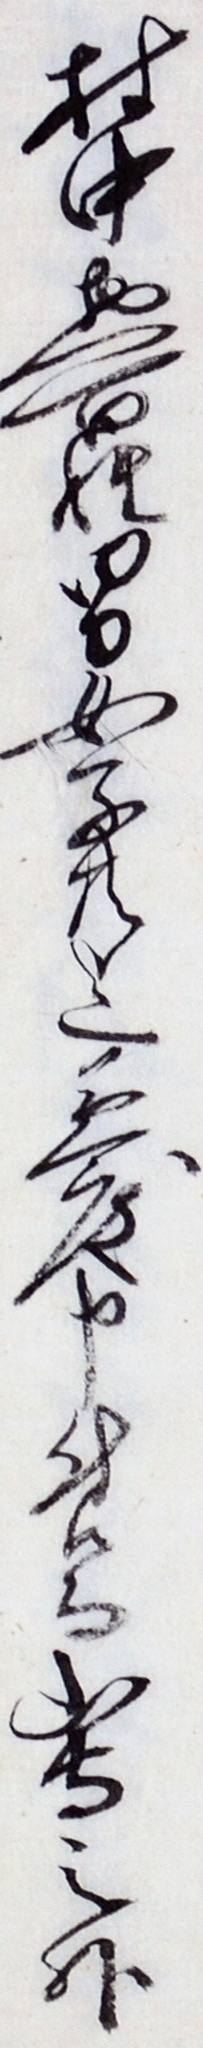村中惣百姓男女子共迄急度申付候而山守之外
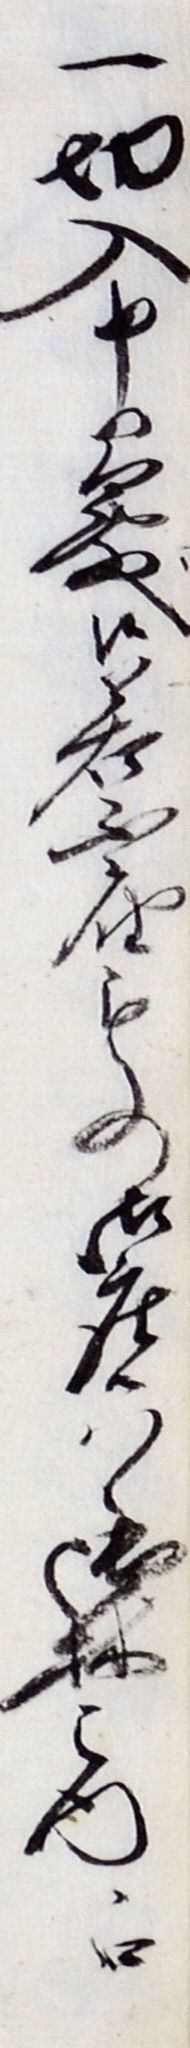一切入申間敷候若不届もの御座候ハヽ御林之内え
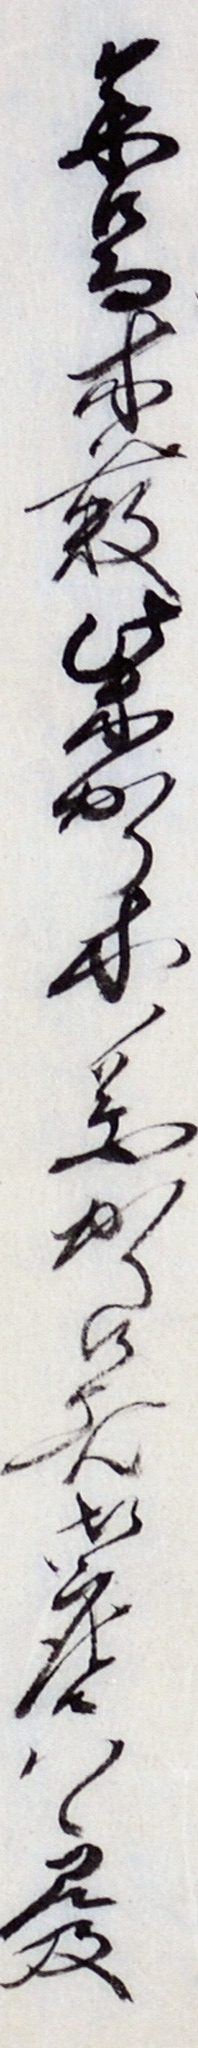参候而木薮柴かり木ノ葉かり候者御座候ハヽ見及
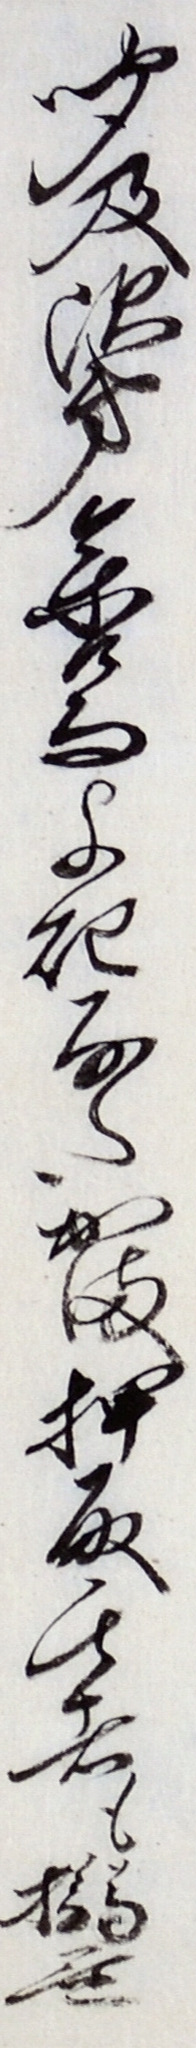聞及次第参候而よきなたかま押取其者も搦置
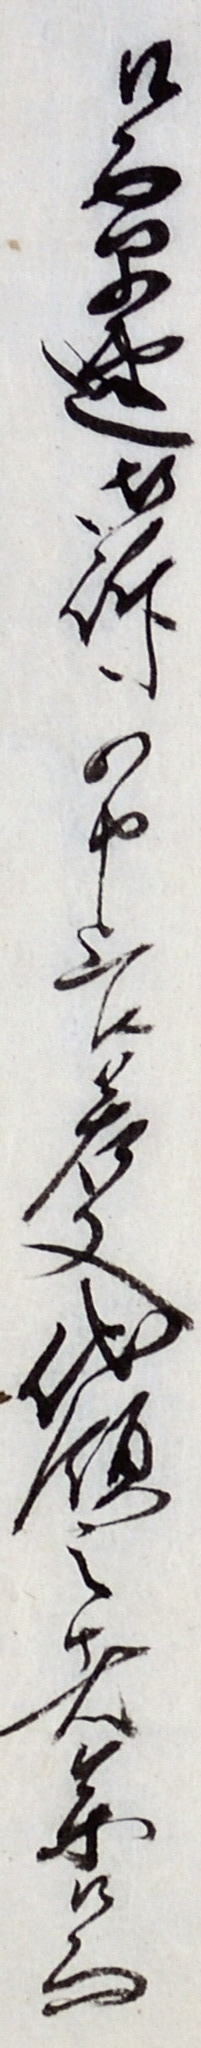候而早速御仰可申上候若又地領之者参候而
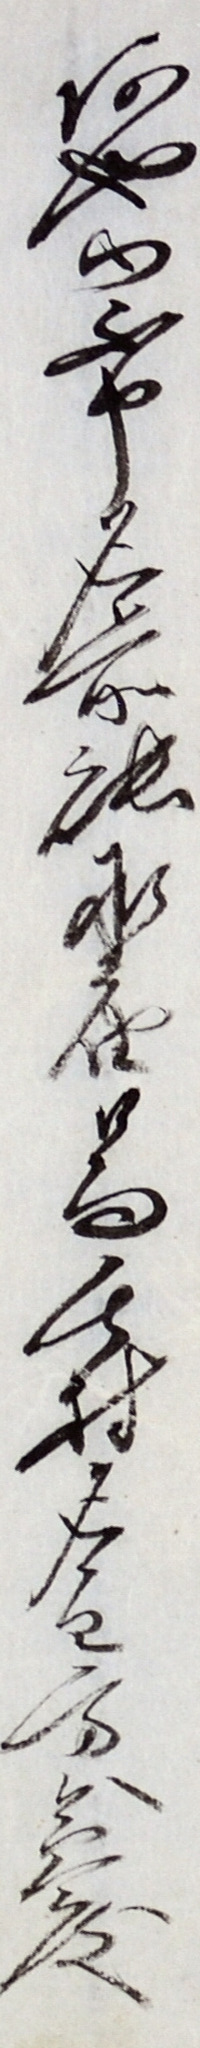あやめ不申名前能承届候而其村名主方へ急度
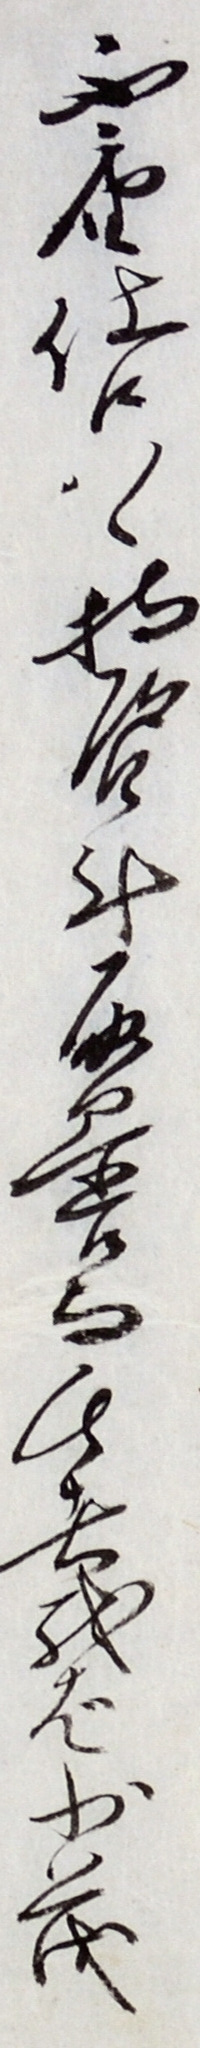不届仕候ハヽ持道具計届置候而其者をば少も
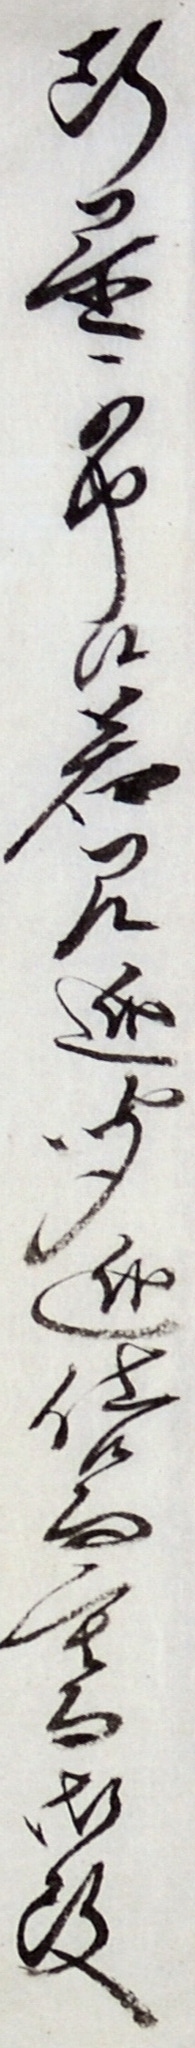断置可申候若見逃聞逃仕候而重而御改
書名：御林御竹藪証文控
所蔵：伊那市立高遠町図書館・合同会社AMANE
